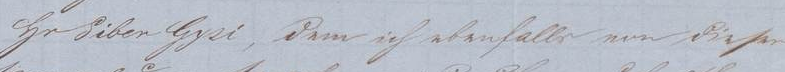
Hr Siber Gysi, dem ich ebenfalls von dieser
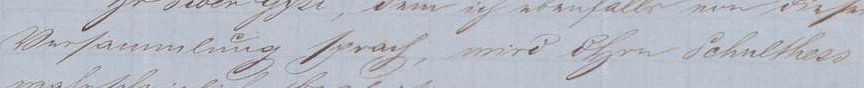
Versammlung sprach, wird den Hrn Schulthess
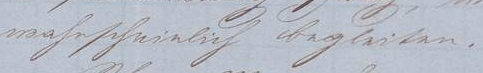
wahrscheinlich begleiten.
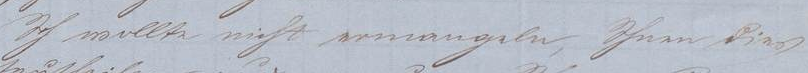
Ich wollte nicht ermangeln, Ihnen dies
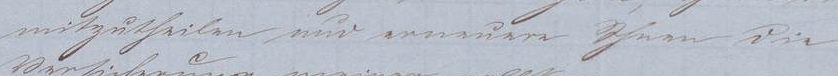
mitzutheilen, und erneuere Ihnen die
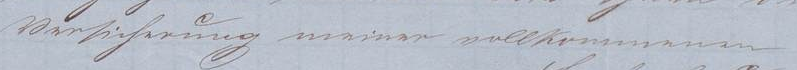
Versicherung meiner vollkommenen
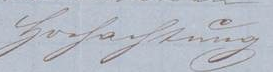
Hochachtung
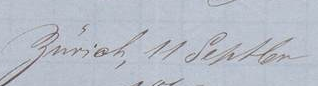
Zürich, 11 Septbr
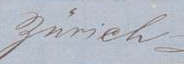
Zürich
